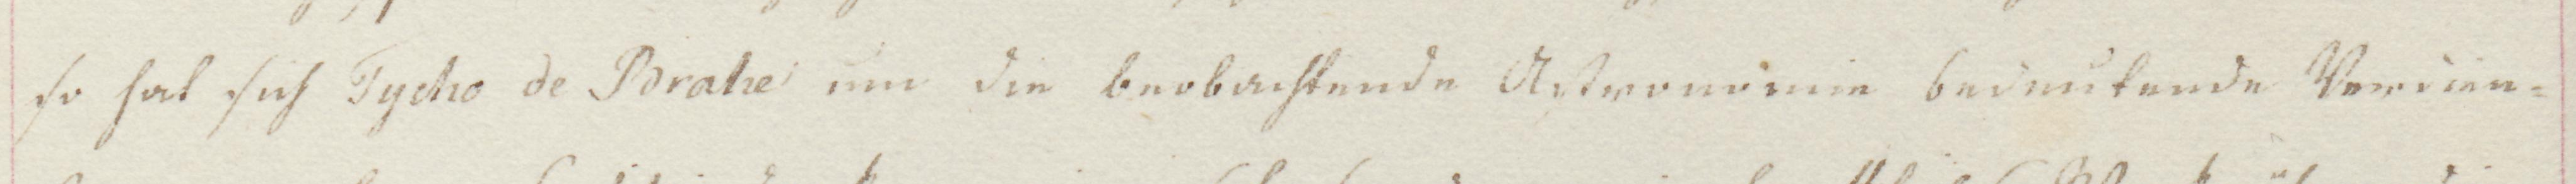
so hat sich Tycho de Brahe um die beobachtende Astronomie bedeutende Verdien-
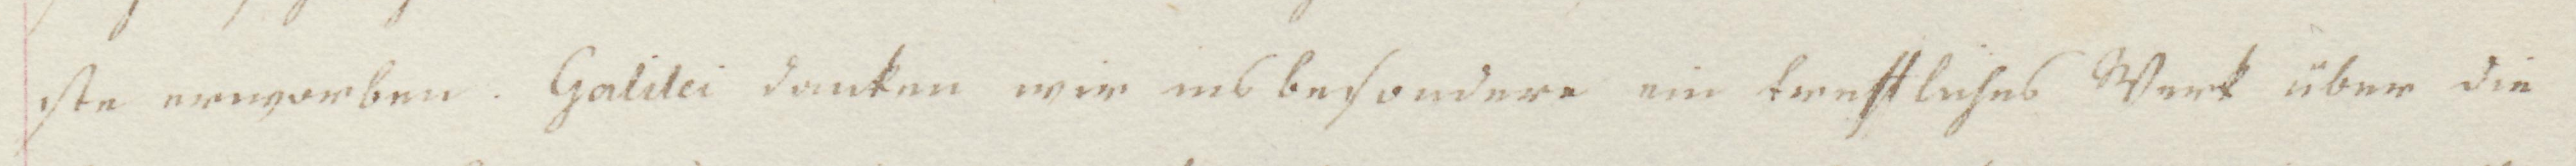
ste erworben. Galilei danken wir insbesondere ein treffliches Werk über die
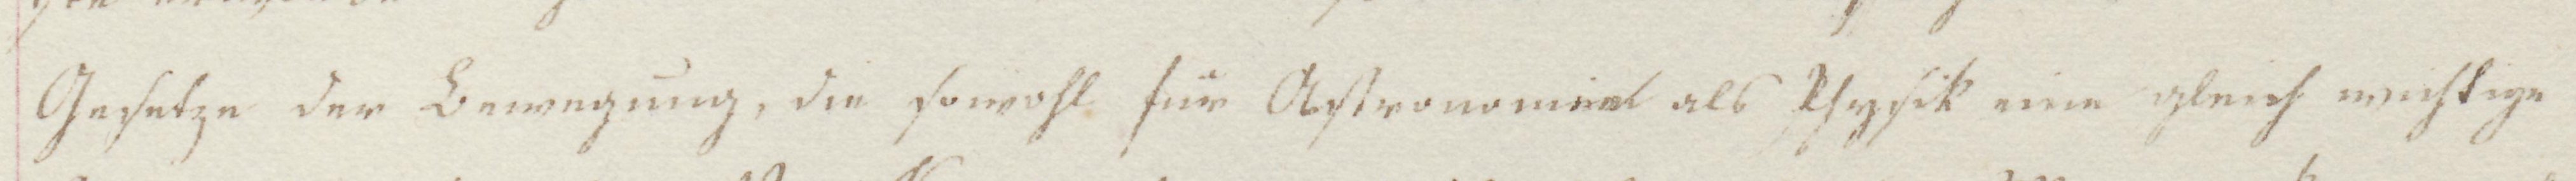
Gesetze der Bewegung, die sowohl für Astronomie als Physik eine gleich wichtige
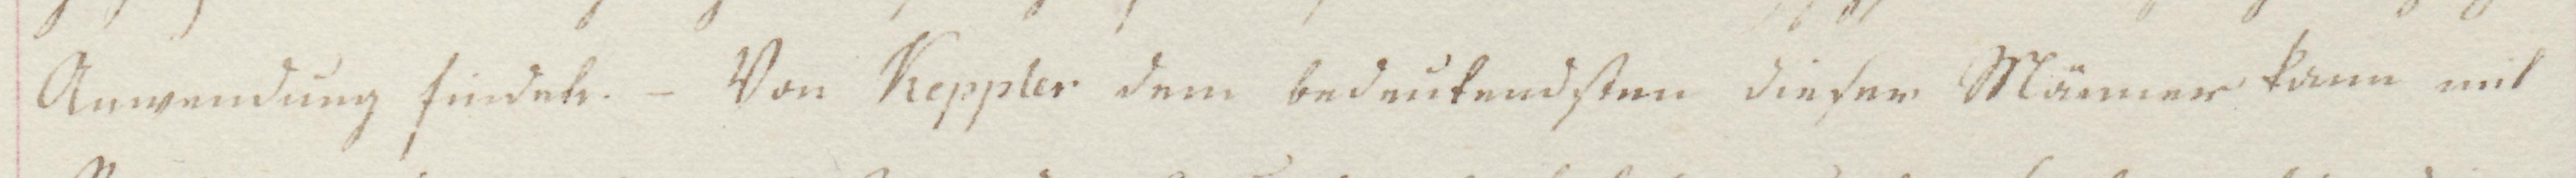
Anwendung finden. – Von Keppler dem bedeutendsten dieser Männer kann mit
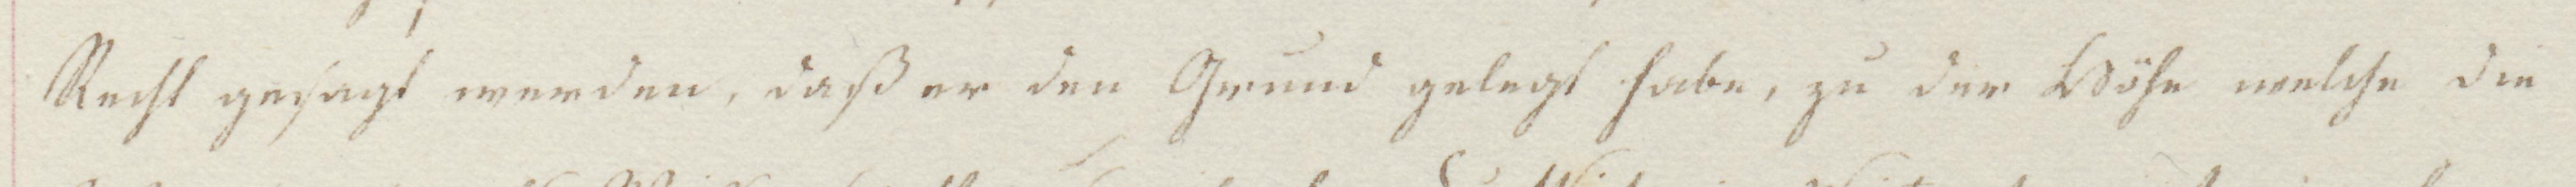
Recht gesagt werden, daß er den Grund gelegt habe, zu der Höhe welche die
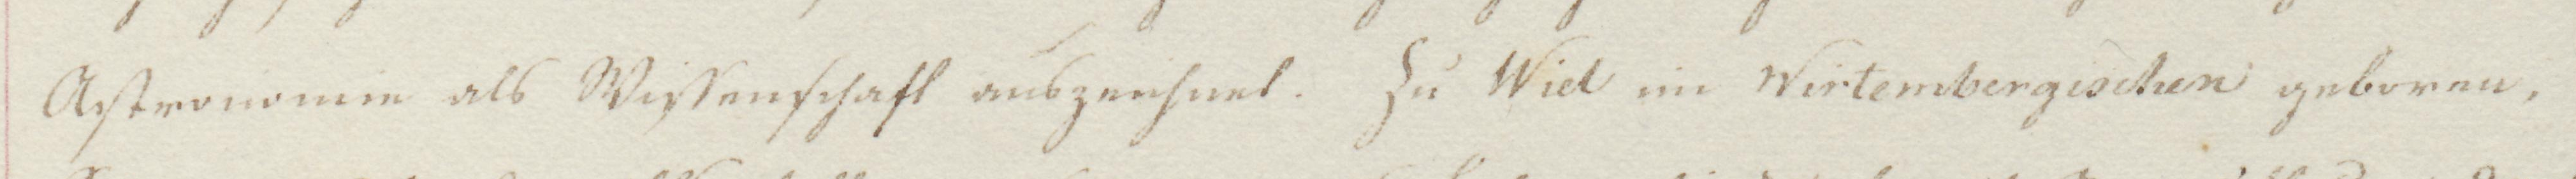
Astronomie als Wissenschaft auszeichnet. Zu Wiel im Wirtembergischen geboren,
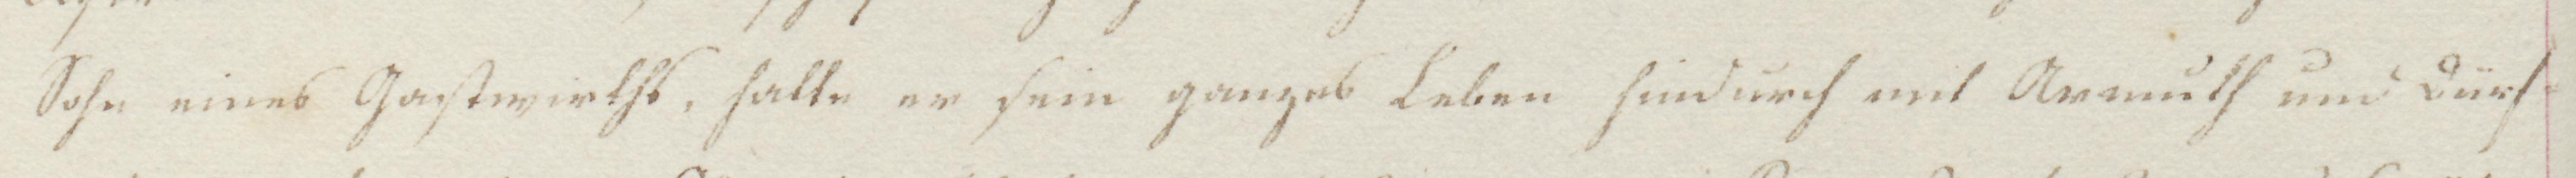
Sohn eines Gastwirths, hatte er sein ganzes Leben hindurch mit Armuth und Dürf-
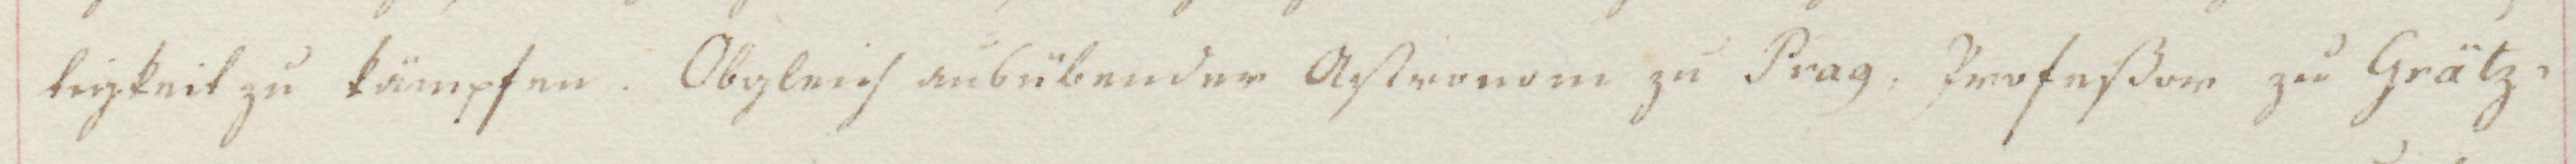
tigkeit zu kämpfen. Obgleich ausübender Astronom zu Prag, Profeßor zu Grätz,
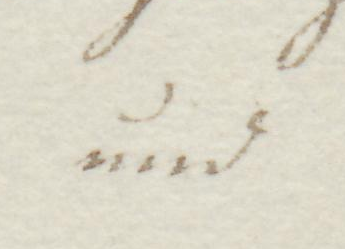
und
